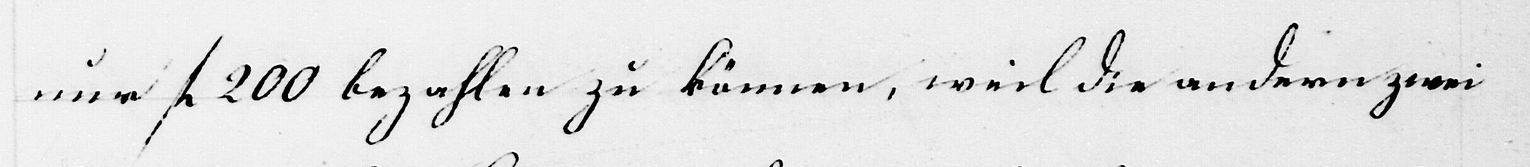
nur fl 200 bezahlen zu können, weil die andern zwei
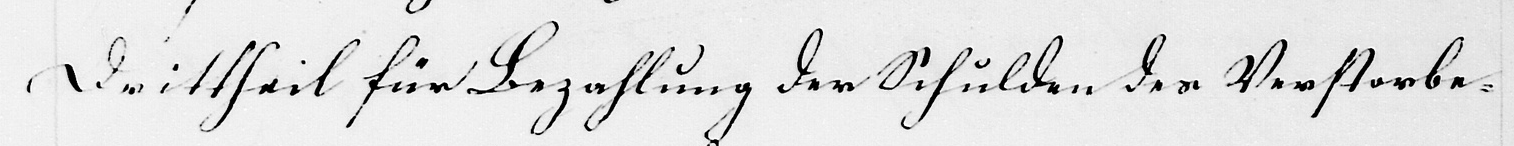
Drittheil für Bezahlung der Schulden des Verstorbe¬
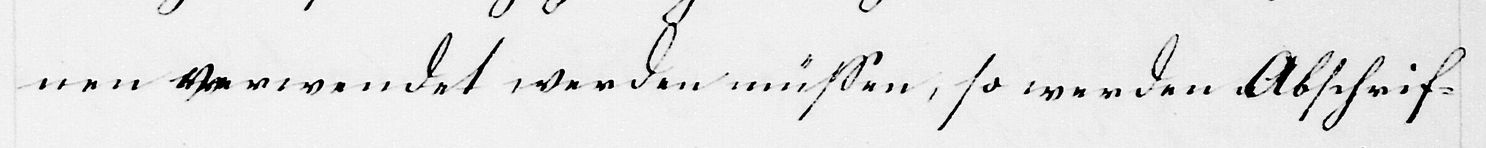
nen verwendet werden müßen, so werden Abschrif¬
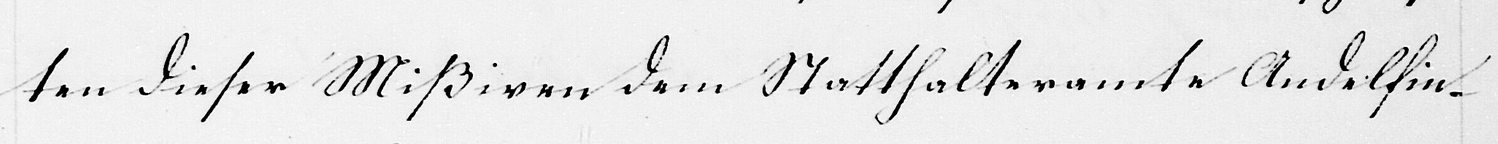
ten dieser Mißiven dem Statthalteramte Andelfin¬
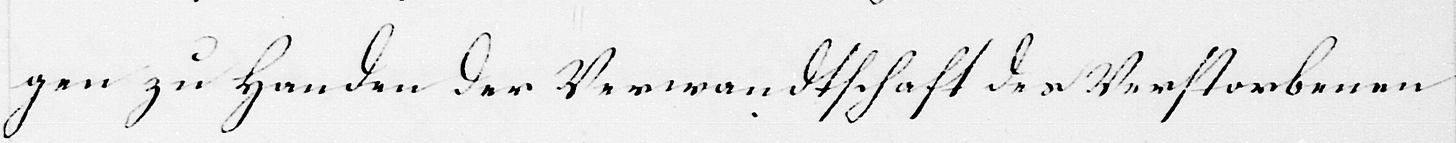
gen zu Handen der Verwandtschaft des Verstorbenen
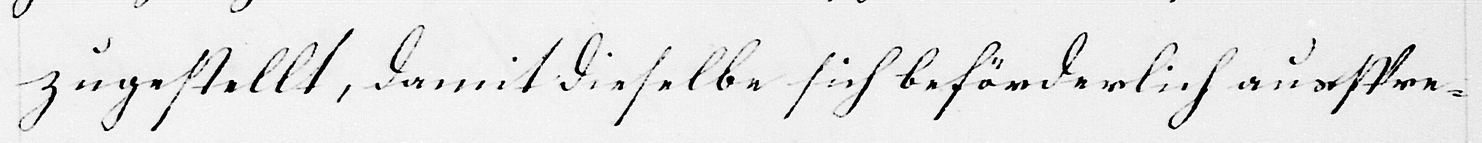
zugestellt, damit dieselbe sich beförderlich ausspre¬
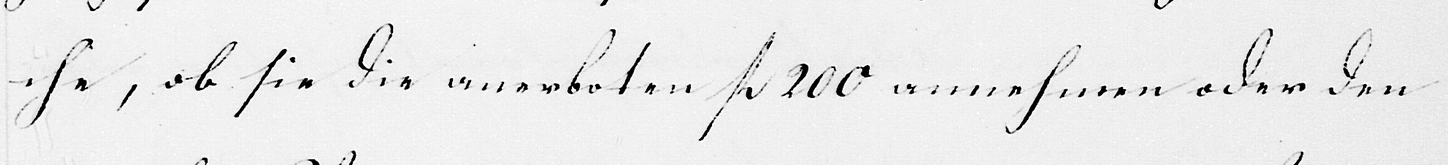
che, ob sie die anerboten fl 200 annehmen oder den
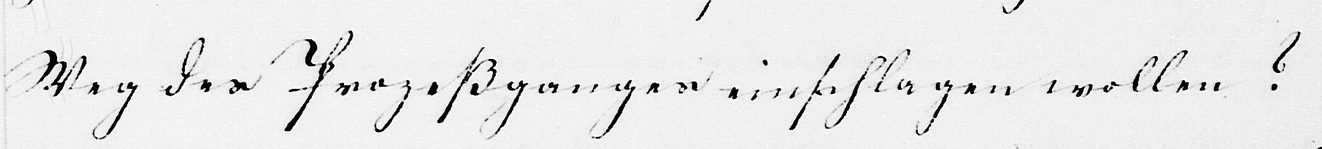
Weg des Prozeßganges einschlagen wollen?
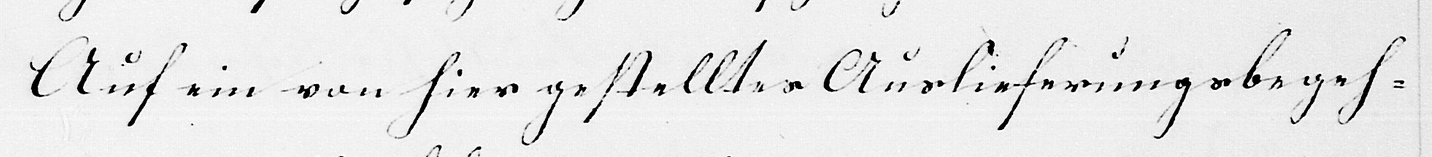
Auf ein von hier gestelltes Auslieferungsbegeh¬
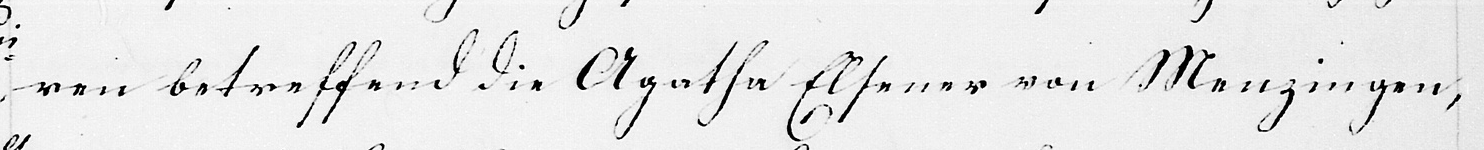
ren betreffend die Agatha Elsener von Menzingen,
